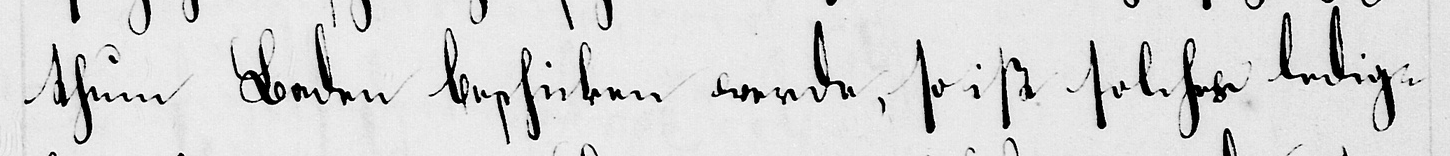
thum Baden beschicken werde, so ist solches ledig¬
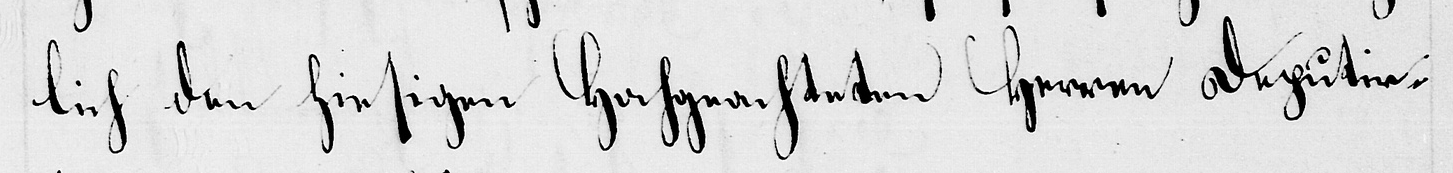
lich den hiesigen Hochgeachteten Herren Deputir¬
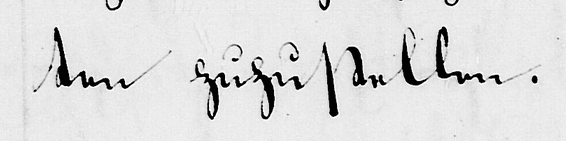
ten zuzustellen.
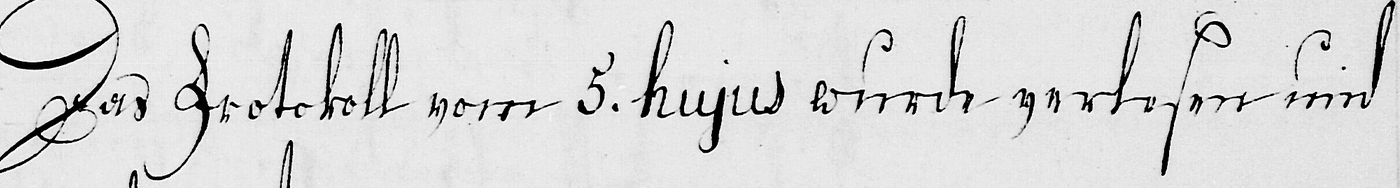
Das Protokoll vom 5. hujus wurde verlesen und
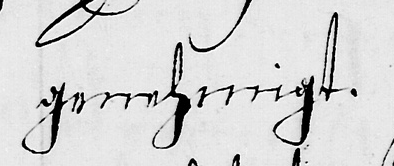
genehmigt.
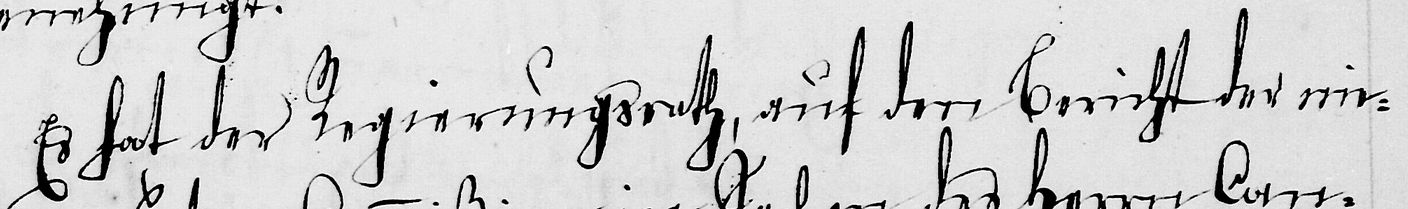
Es hat der Regierungsrath, auf den Bericht der nie¬
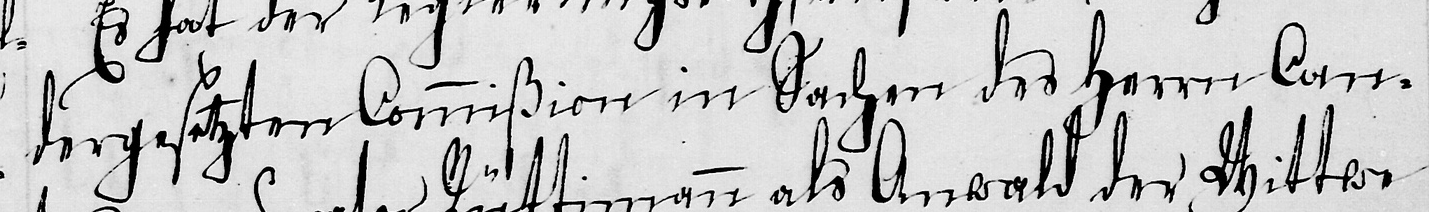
dergesetzten Commißion in Sachen des Herrn Can¬
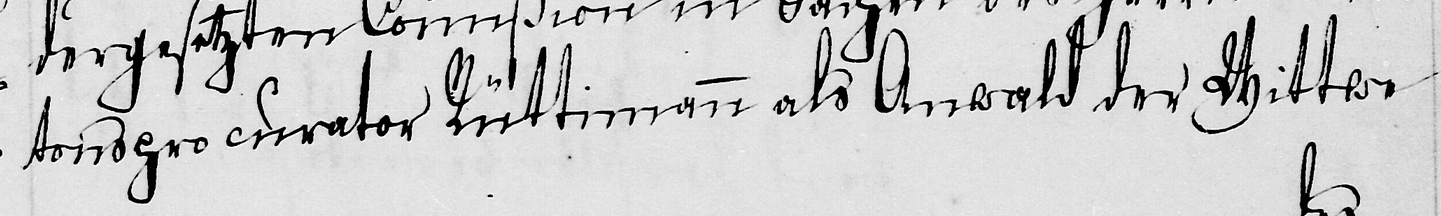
tonsprocurator Rüttimann als Anwald der Wittwe
